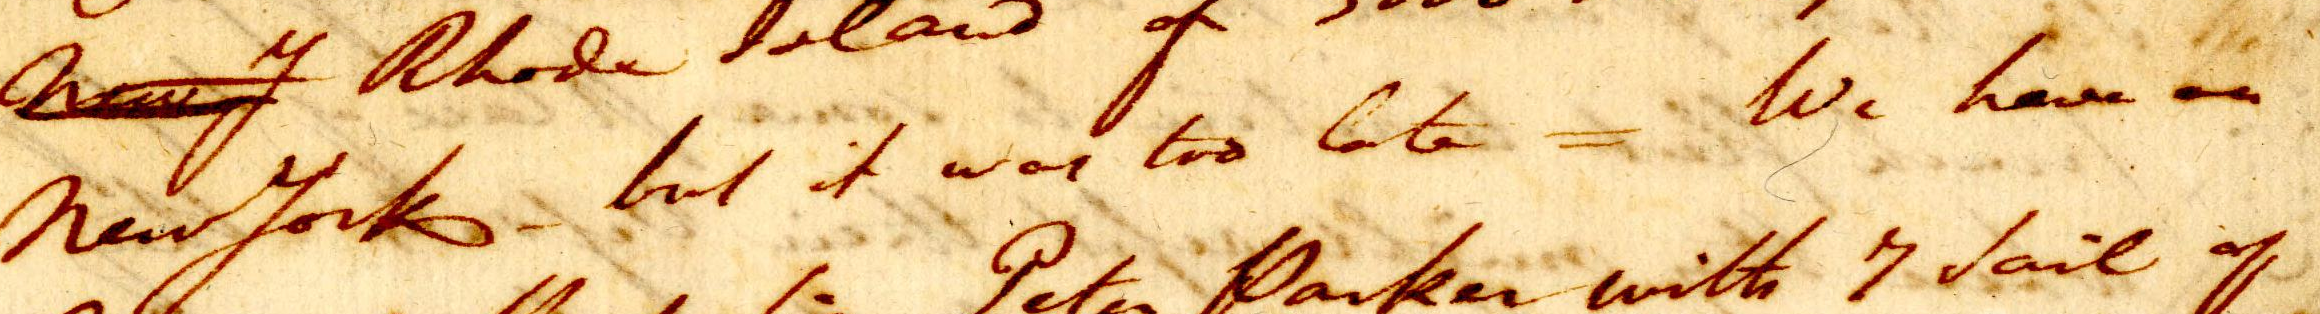New York, but it was too late. We have an
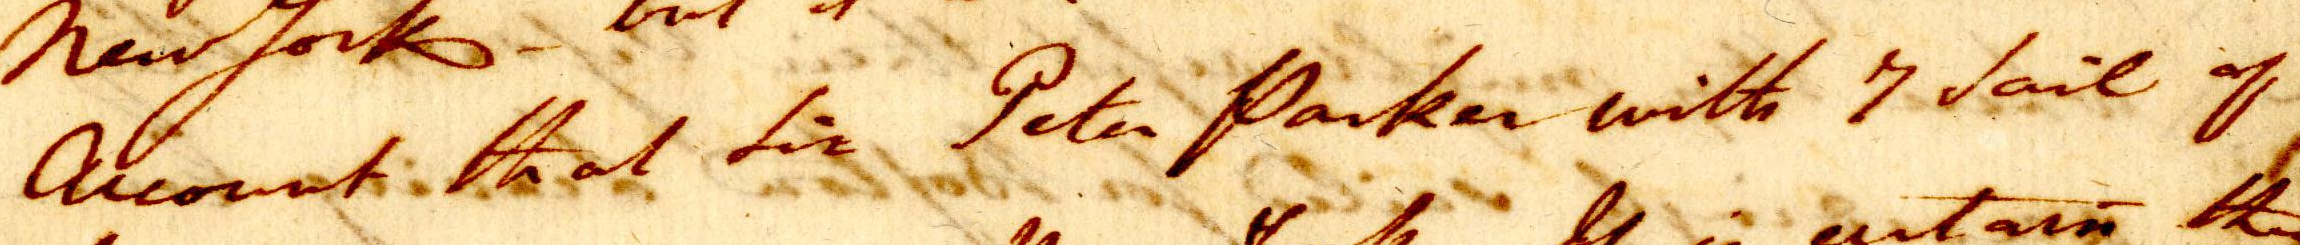Account that Sir Peter Parker with 7 Sail of
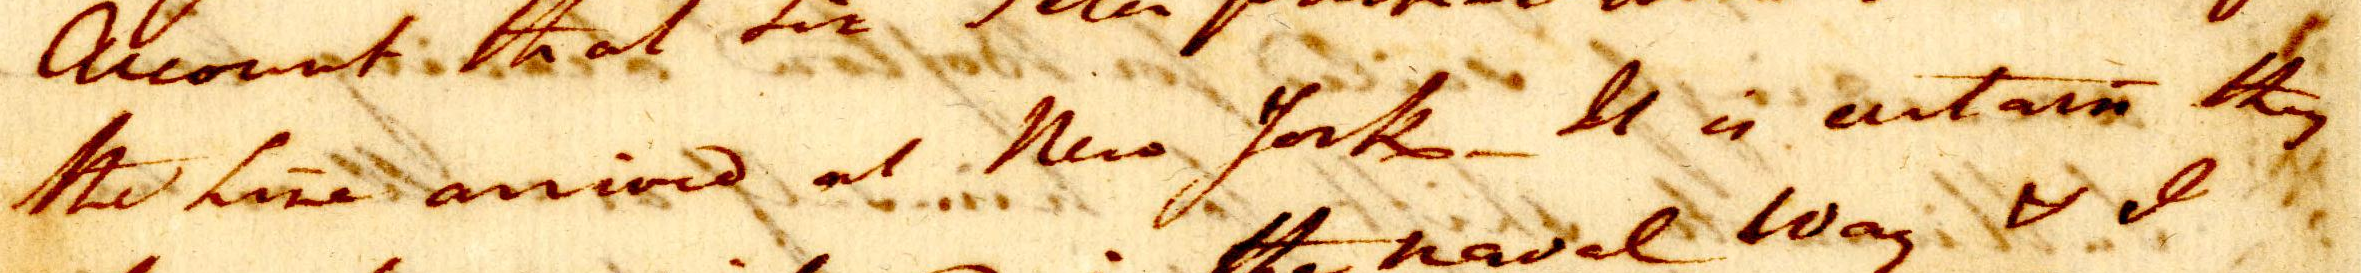the Line arrived at New York. It is certain they
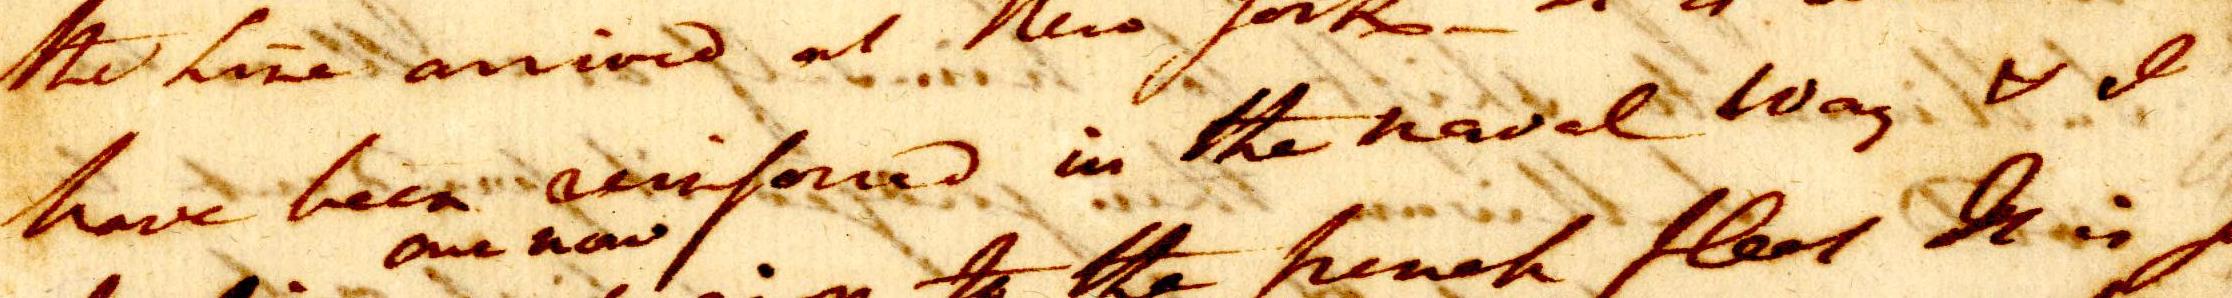have been reinforced in the naval Way & I
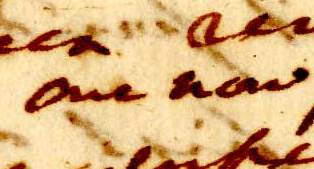are now
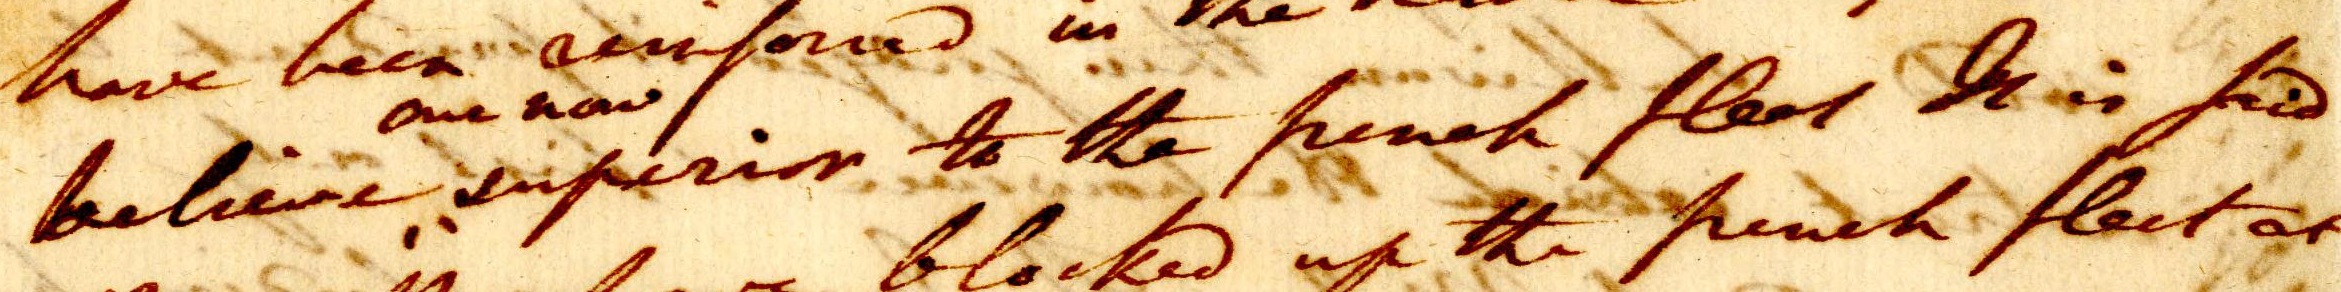believe ^ superior to the French fleet It is said
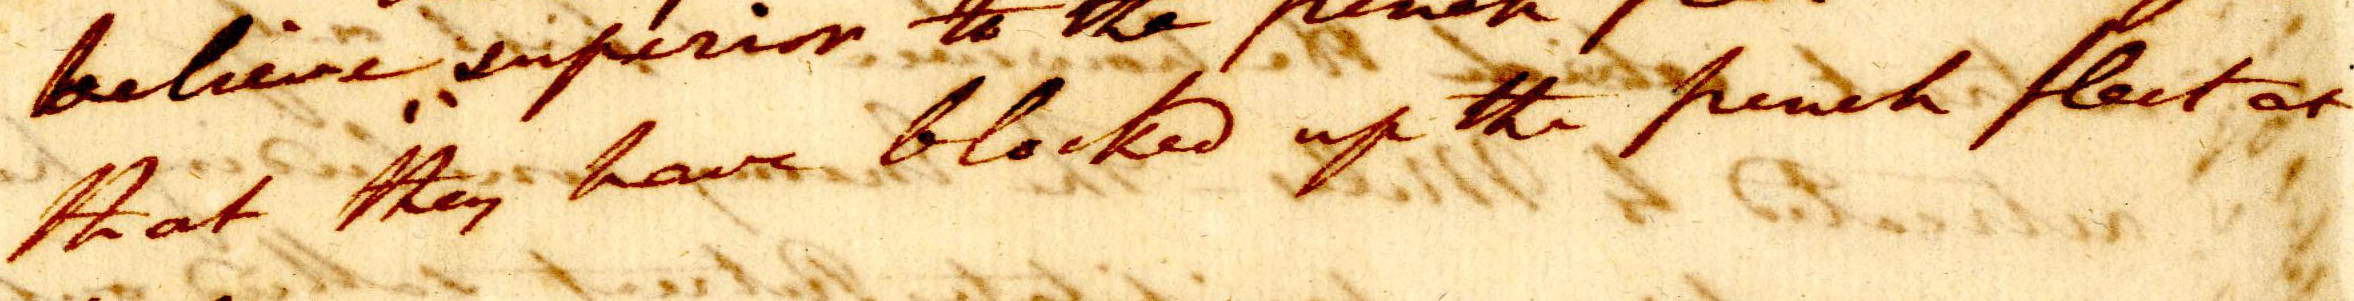that they have blocked up the French fleet at
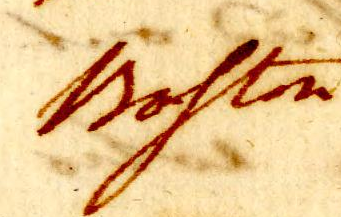Boston.
